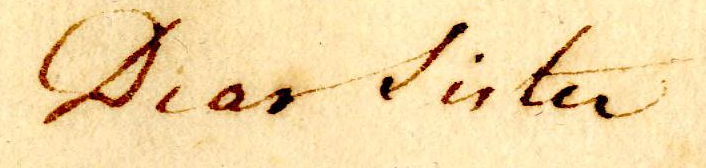Dear Sister
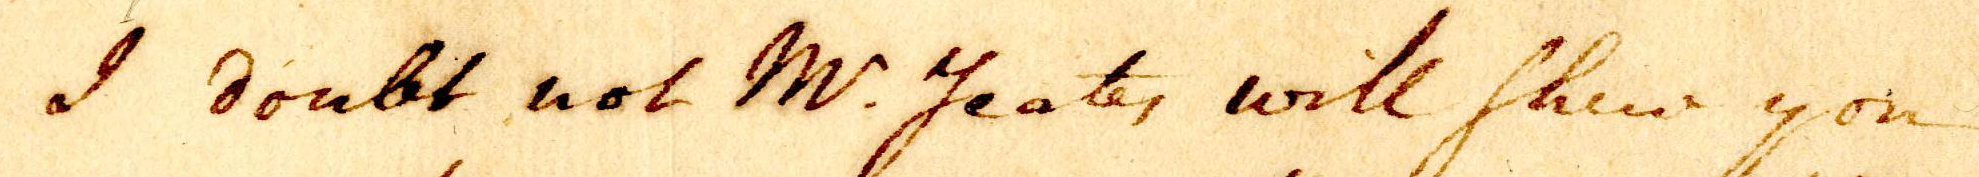I doubt not M^r. Yeates will shew you
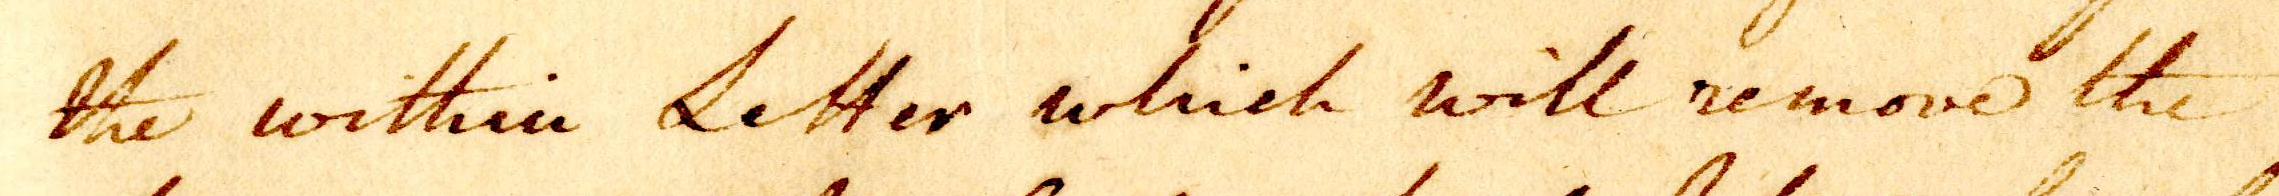the within Letter which will remove the
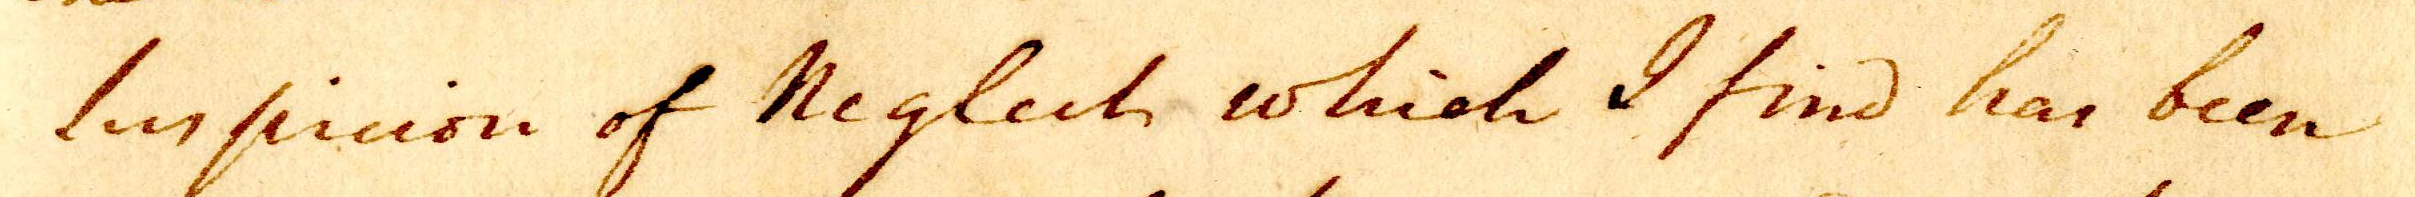Suspicion of Neglect which I find has been
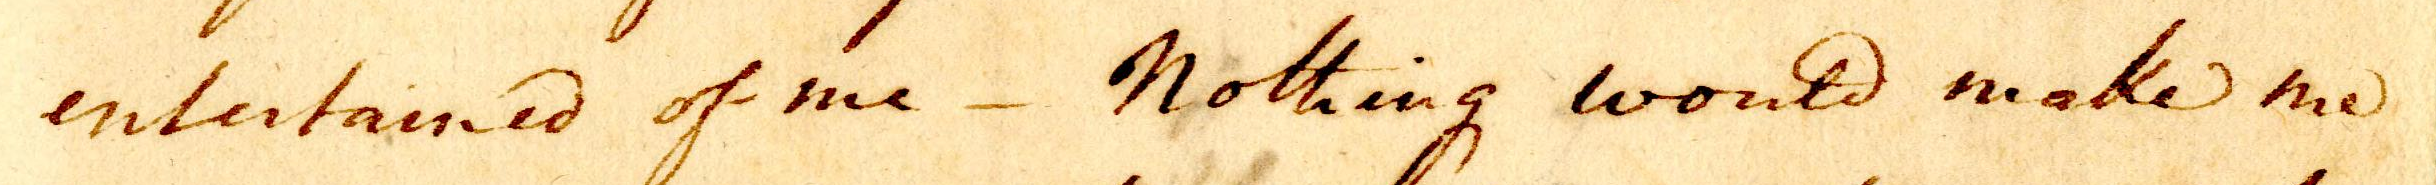entertained of me. Nothing would make me
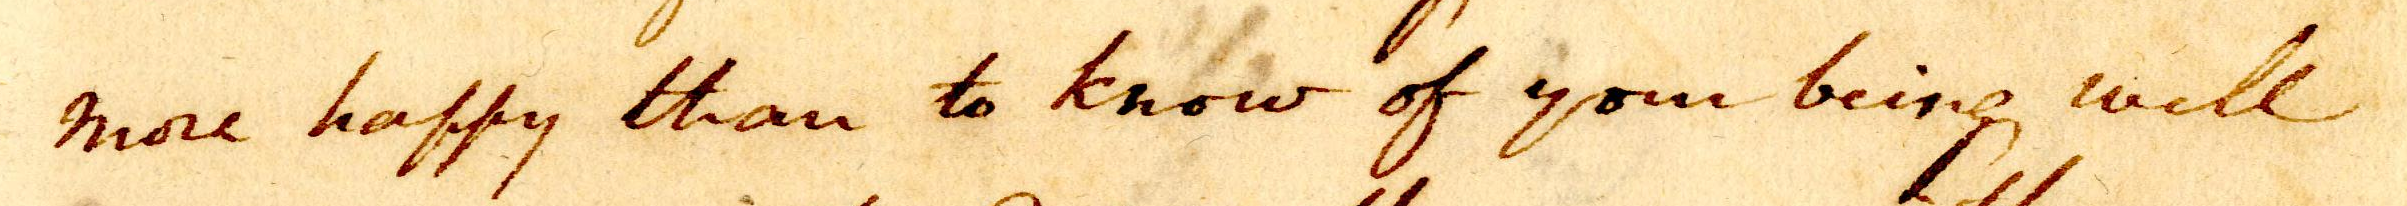more happy than to know of your being well
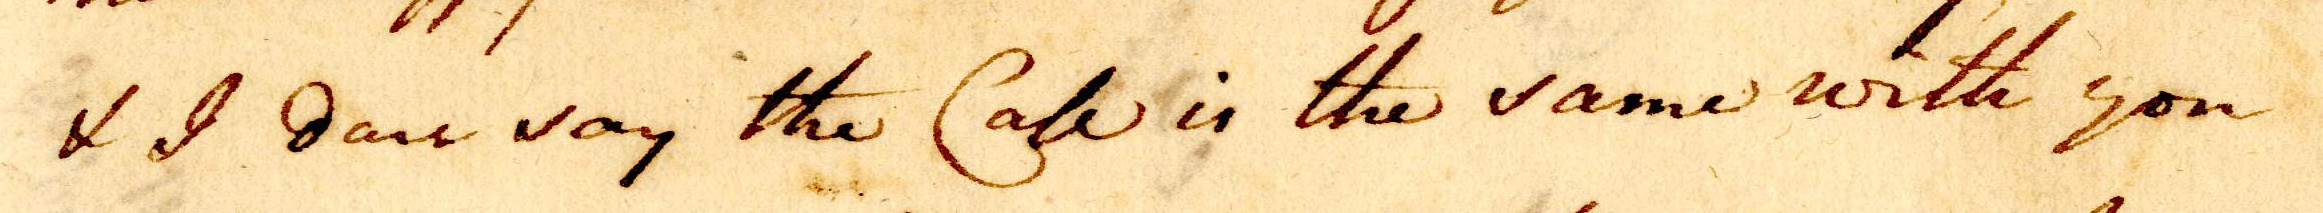& I dare say the Case is the same with you
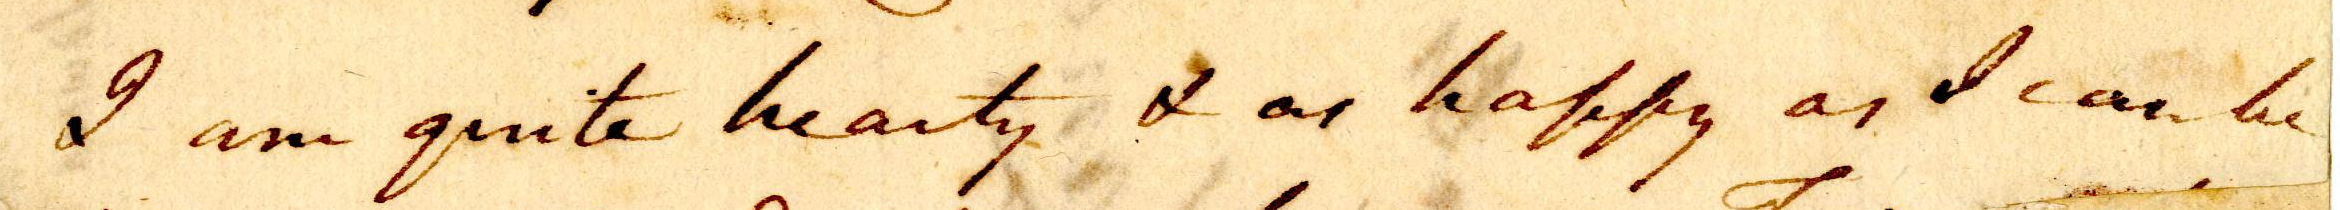I am quite hearty & as happy as I can be
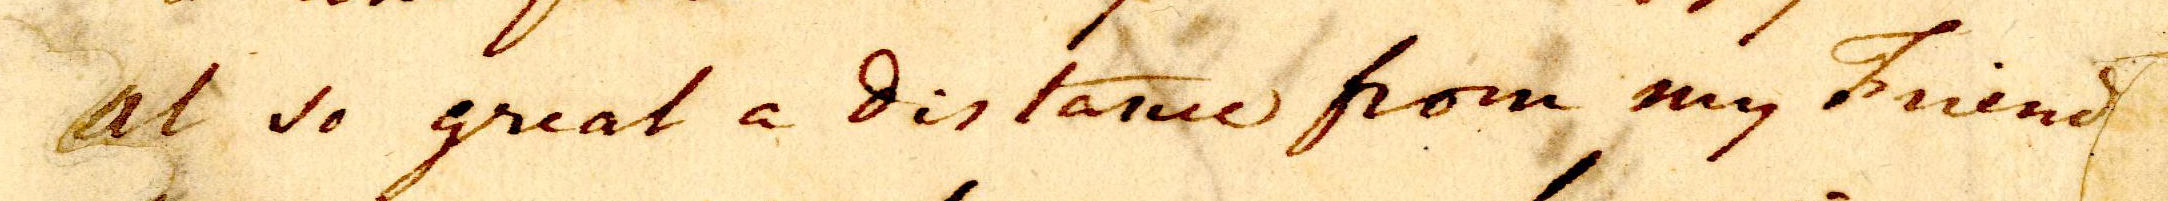At so great a distance from my Friend
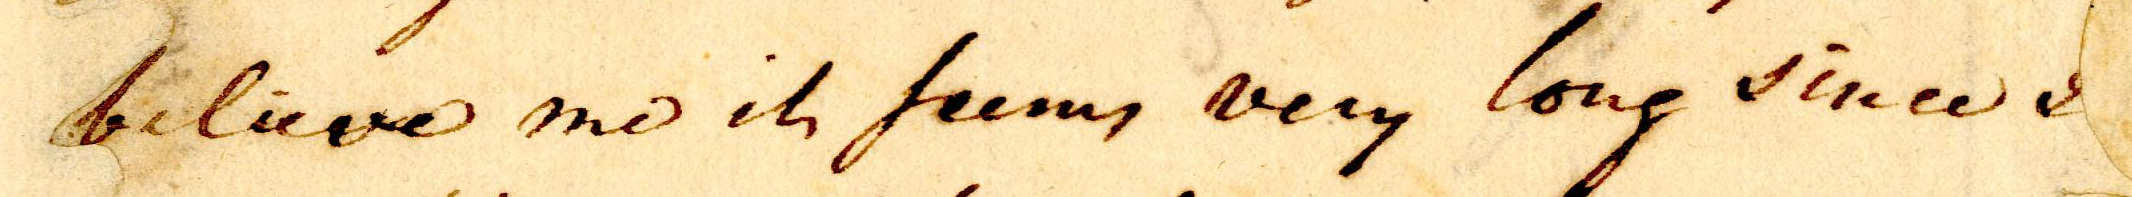believe me its seems very long since I
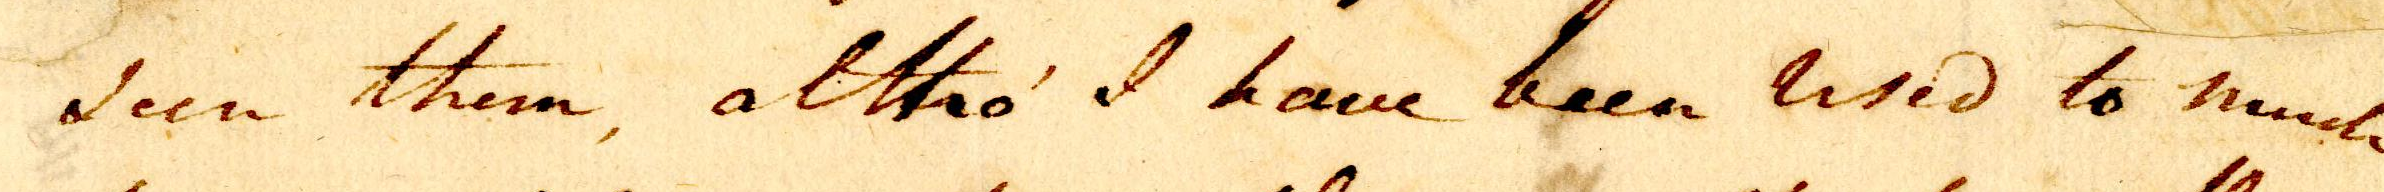seen them altho' I have been used to much
